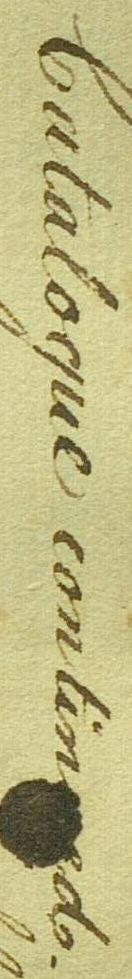Catalogue continued.
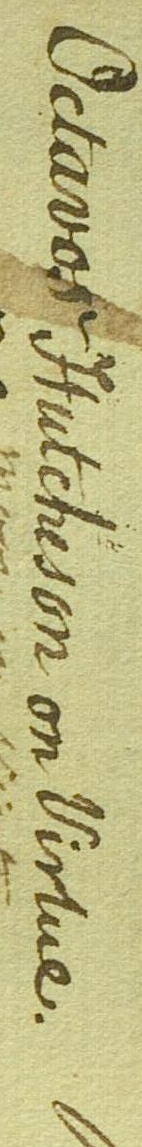Octavos -Hutcheson on Virtue.
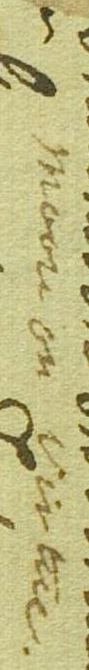- Moore on Virtue.
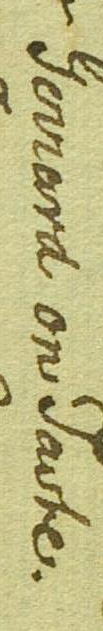- Gerrard on Taste.
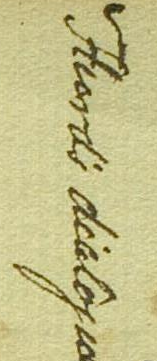- Heard's dialogues
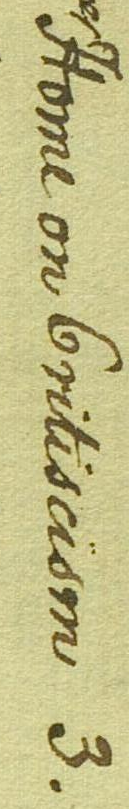Home on Critiscism 3.
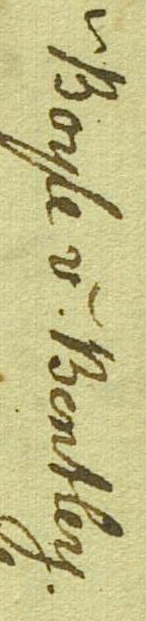- Boyle v. Bentley.
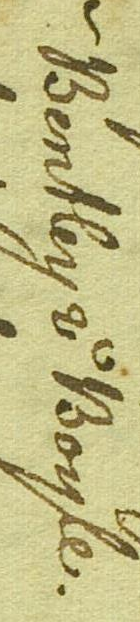- Bentley v Boyle.
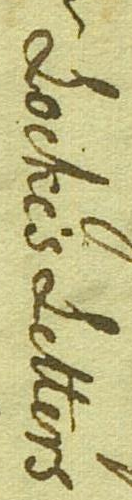- Locke's Letters
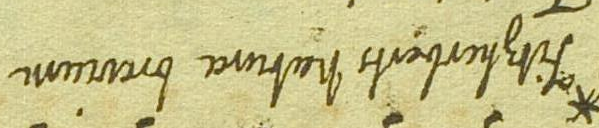Fitzherberts Natura brevium
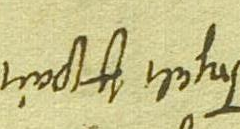Tryals & pair
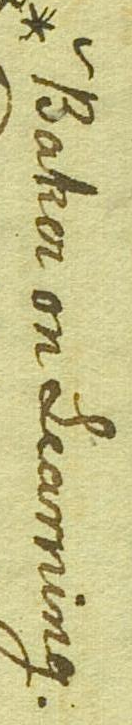* - Baker on Learning.
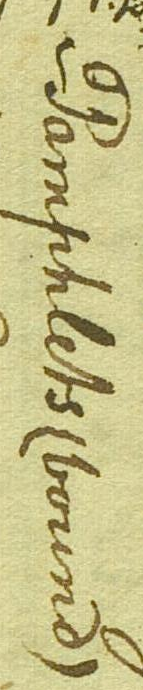- Pamphlets (bound)
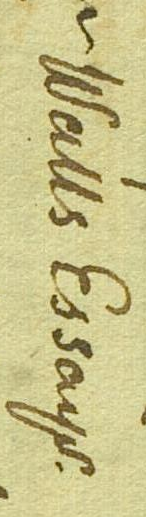- Walls Essays.
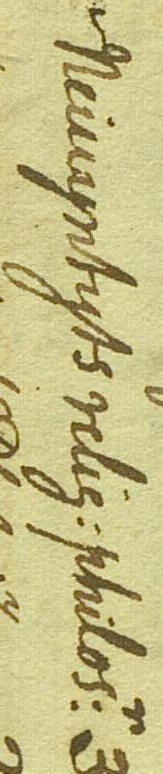- Neiuyntyts relig: philos^y: 3.
